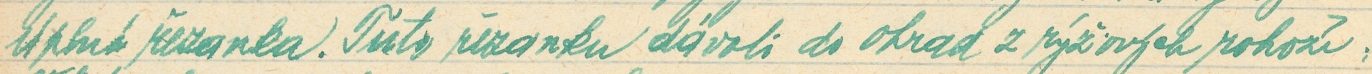úplná řezanka. Tuto řezanku dávali do ohrad z rýžových rohoží.
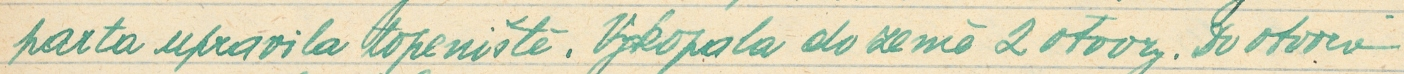parta upravila topeniště. Vykopala do země 2 otvory. Do otvorů
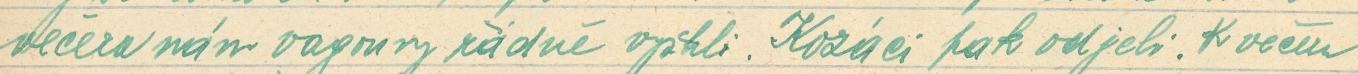večera nám vagonny řádně vyschli. Kozáci pak odjeli. K večeru
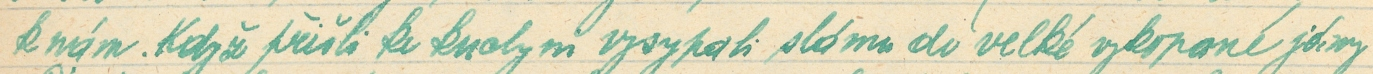k nám. Když přišli ke kuchyni vysypali slámu do velké vykopané jámy.
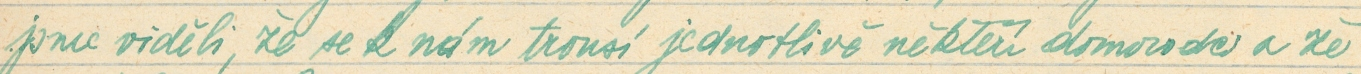jsme viděli, že se k nám trousí jednotlivě někteří domorodci a že
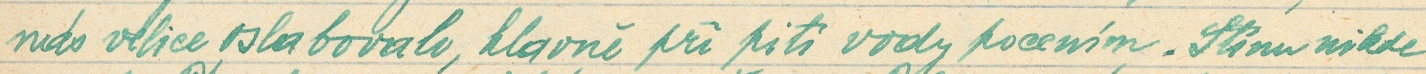nás velice oslabovalo, hlavně při pití vody pocením. Stínu nikde
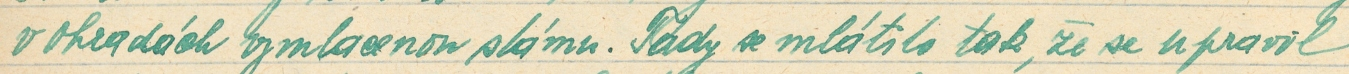v ohradách vymlácenou slámu. Tady se mlátilo tak, že se upravil
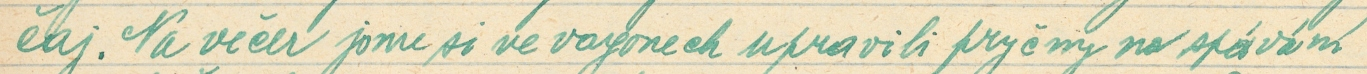čaj. Na večer jsme si ve vagonech upravili pryčny na spávání
